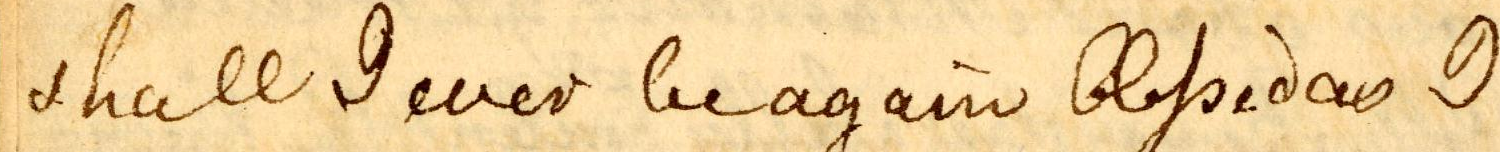shall I ever be again blessed as I
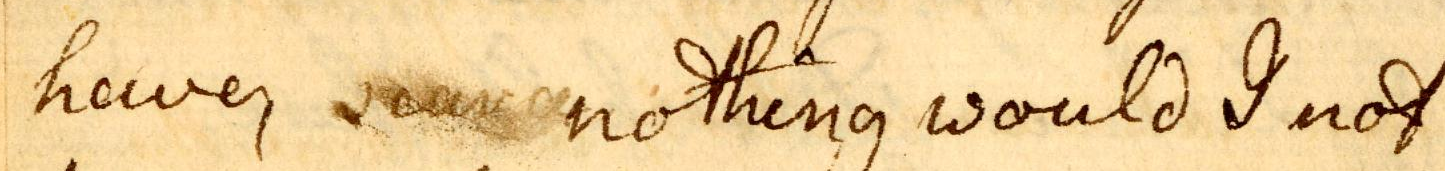have, [____] nothing would I not
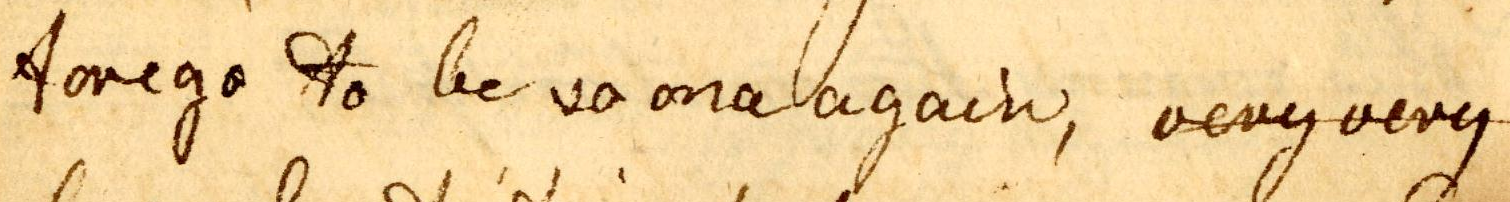forego to be so once again, very very
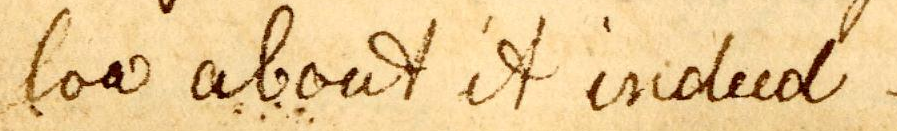low about it indeed
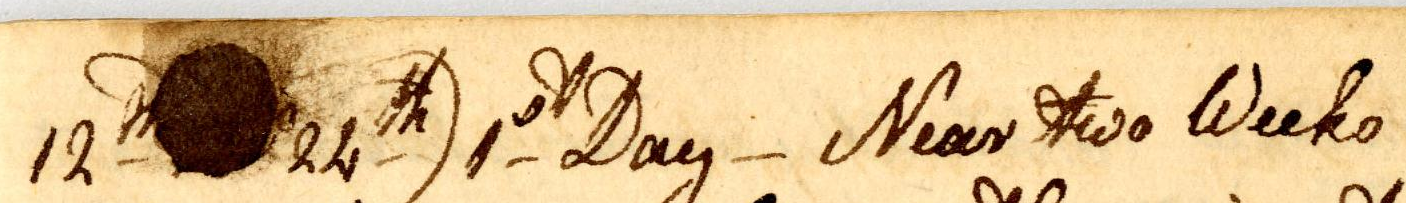12^th [_]^o 24^th) 1^st Day- Near two Weeks
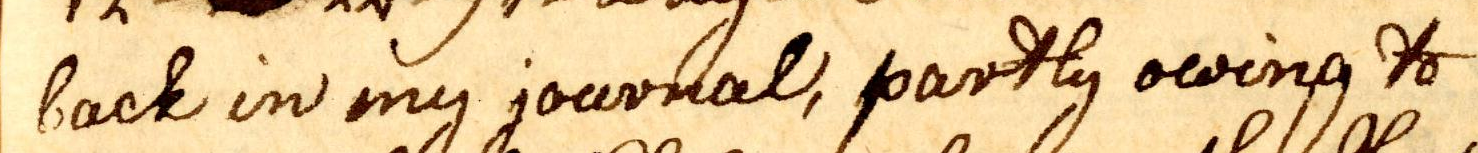back in my journal, partly owing to
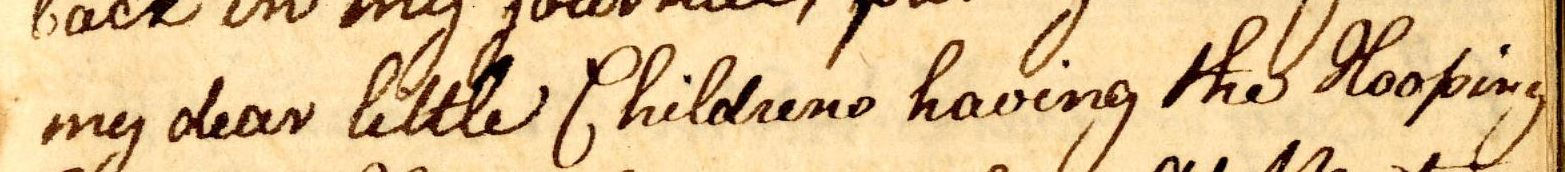my dear little Childrens having the Hooping
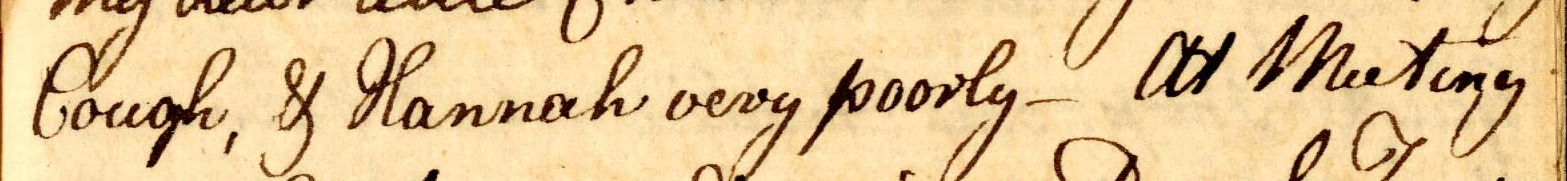Cough, & Hannah very poorly- At Meeting
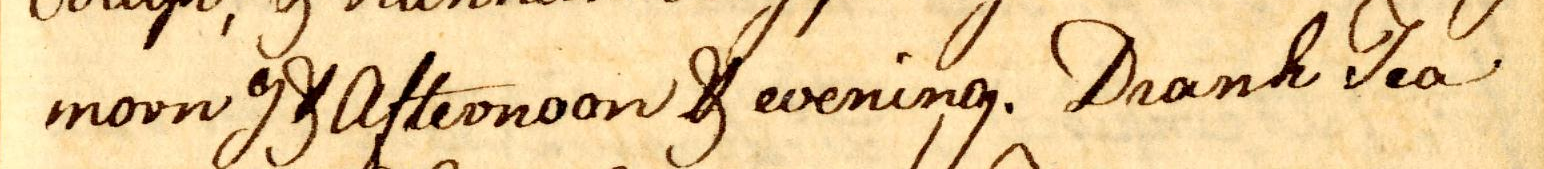morn^g & Afternoon & evening. Drank Tea
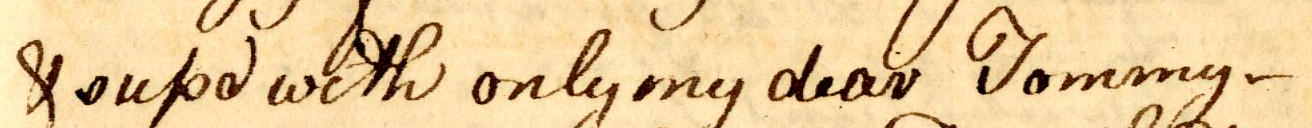& supd with only my dear Tommy-
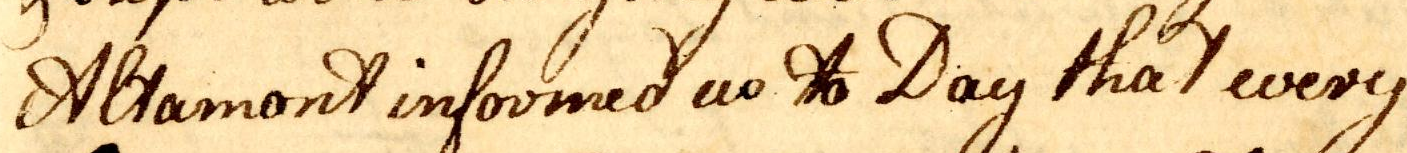Altamont informed us to Day that every
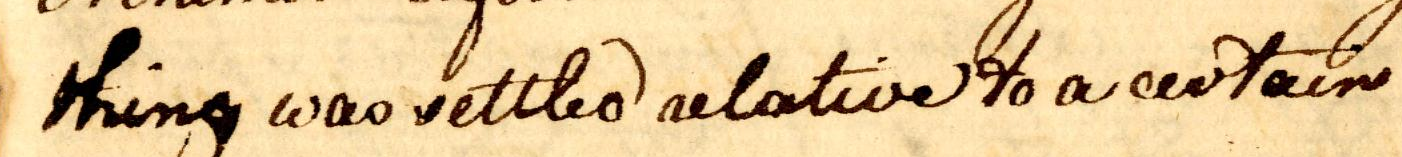thing was settled relative to a certain
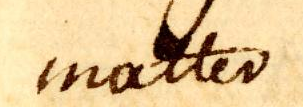matter
